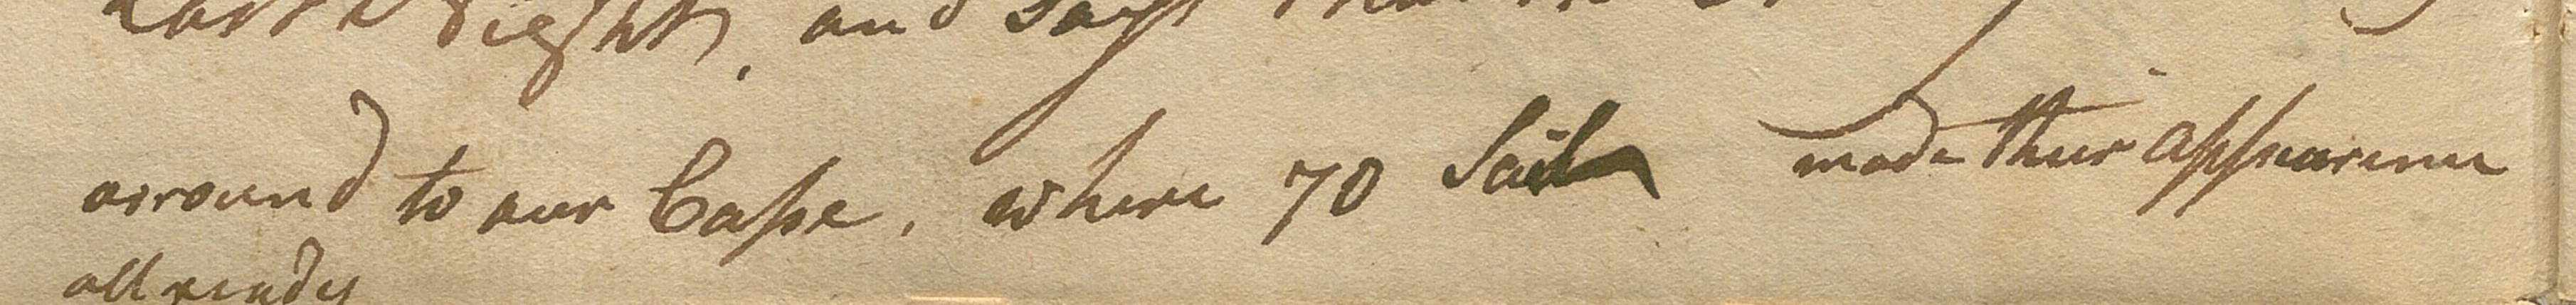arround to our Cape, where 70 Sails made their apppearance
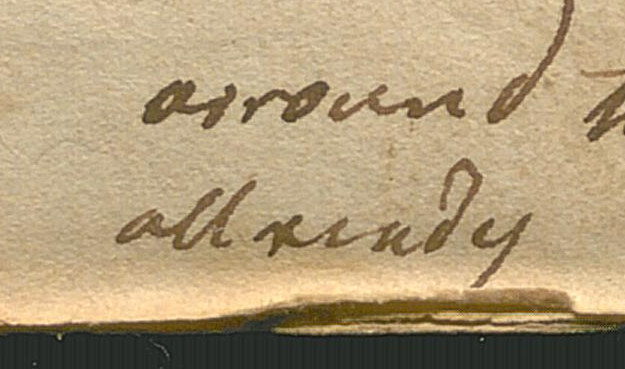all ready
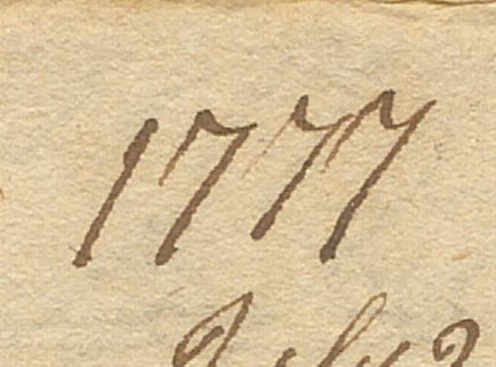1777
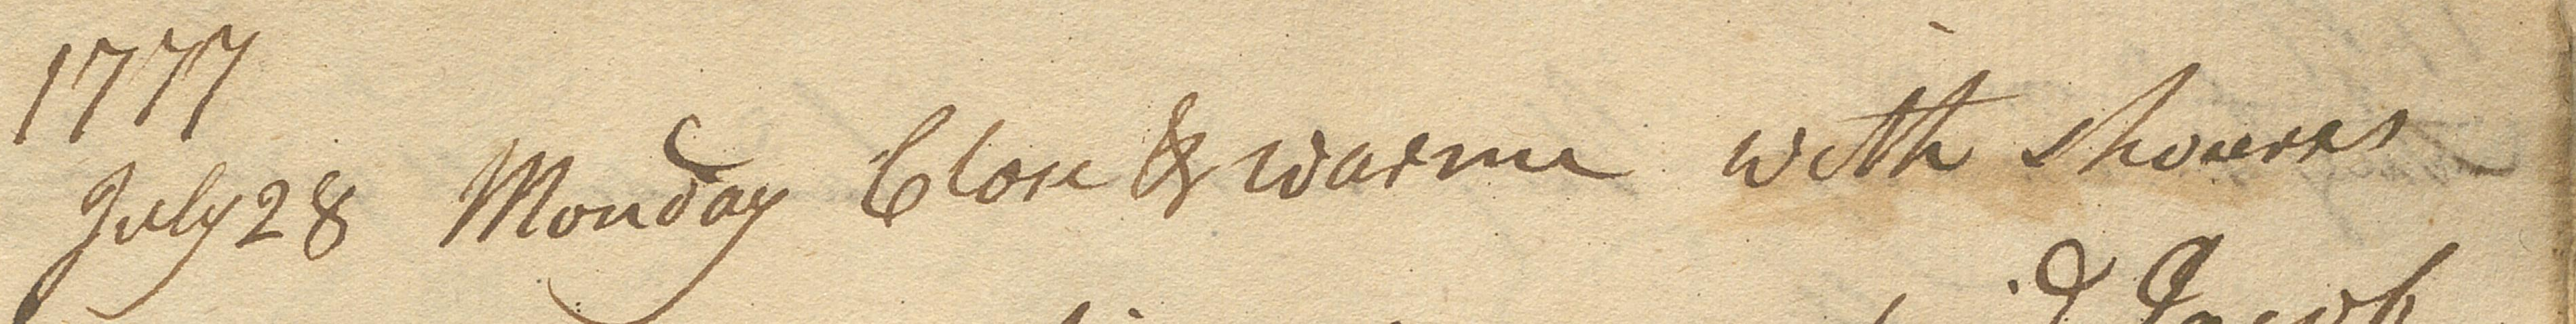July 28 Monday Close & warme with shoures
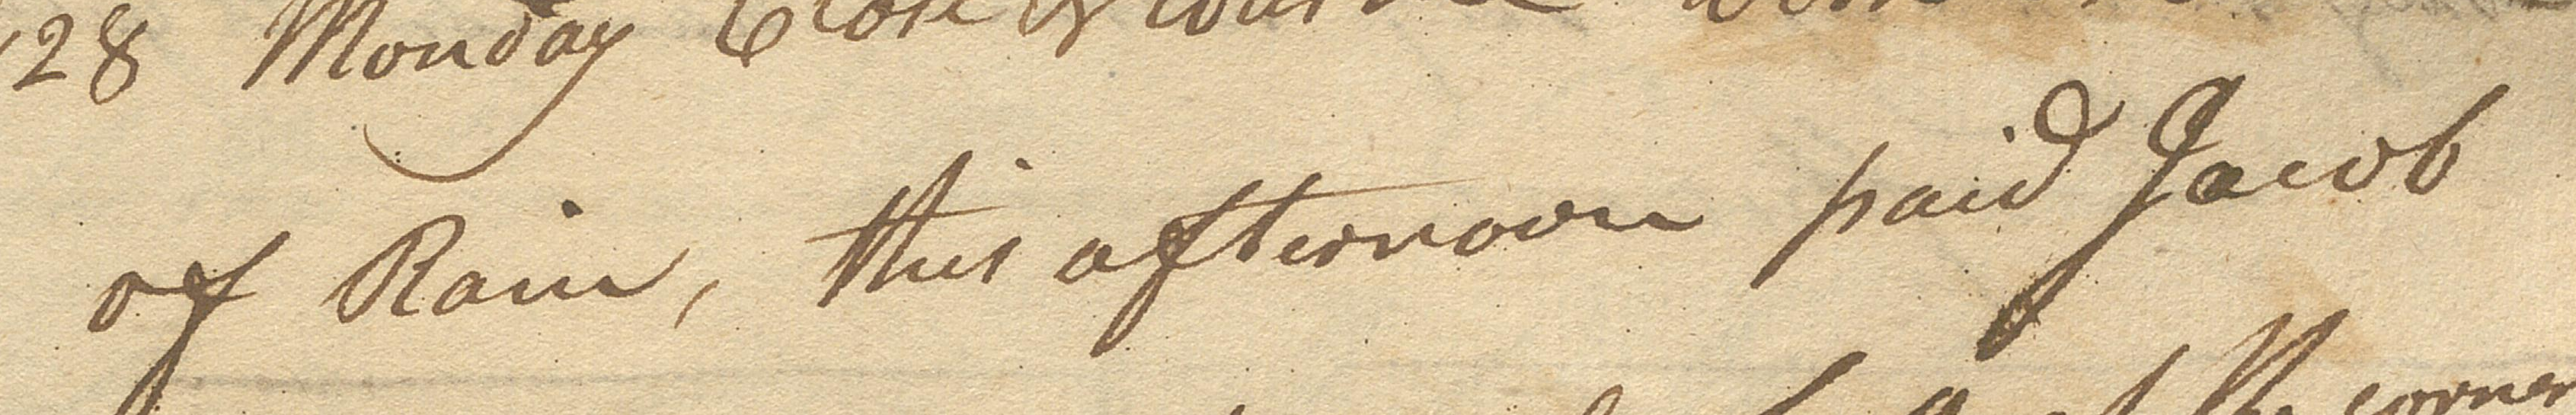of Rain, this afternoon paid Jacob
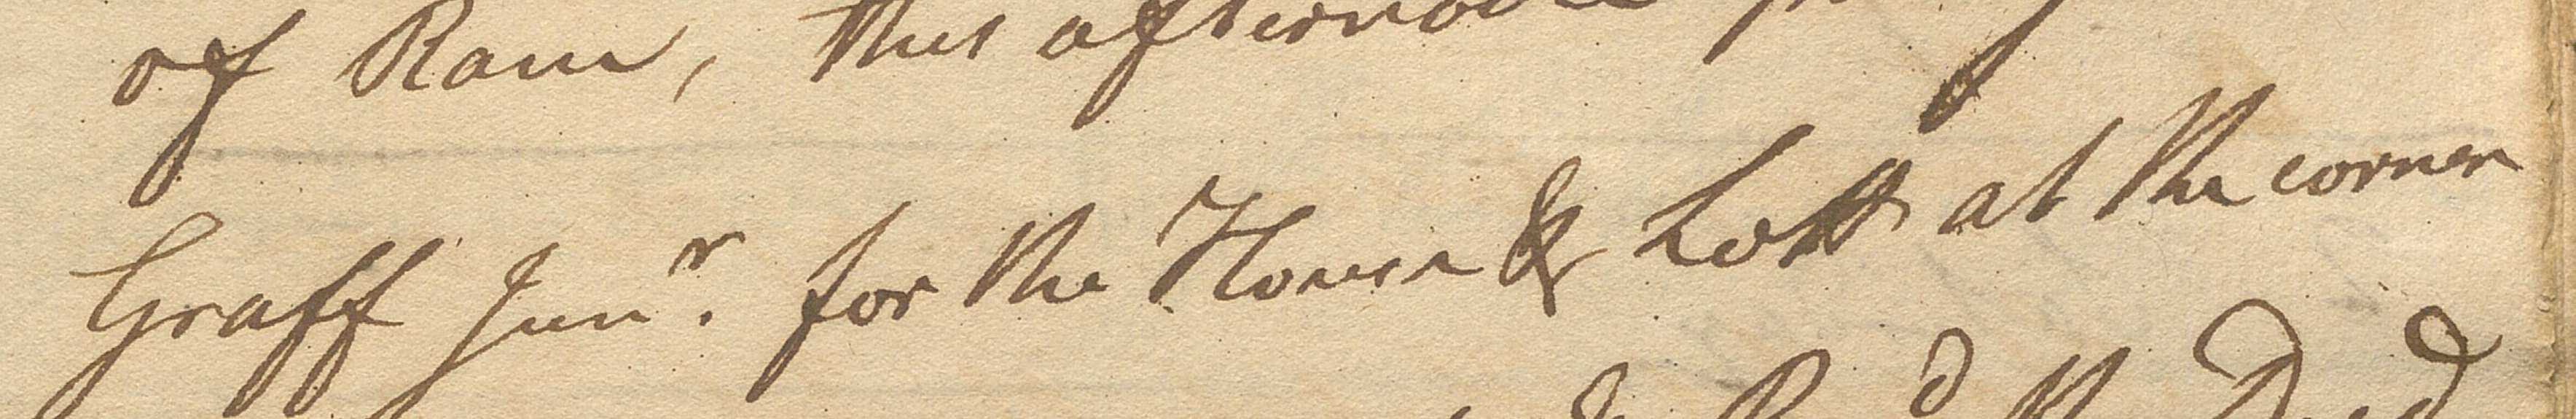Graff Jun^r. for the House & Lolt at the corner
